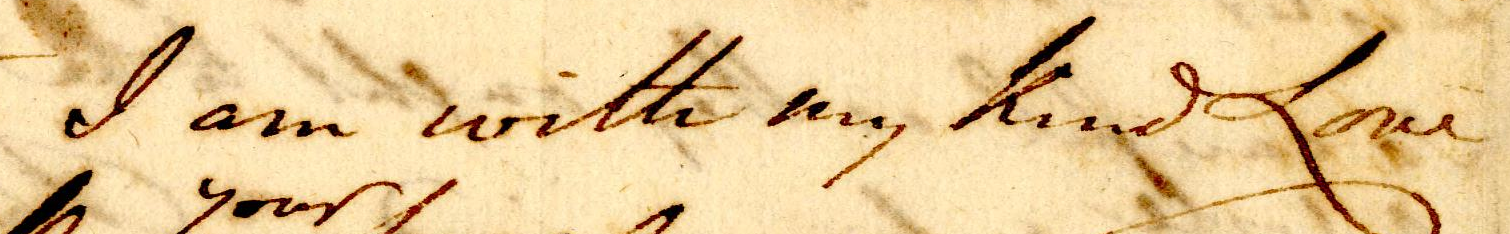I am with my kind Love
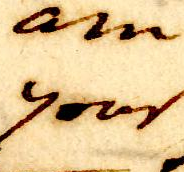your
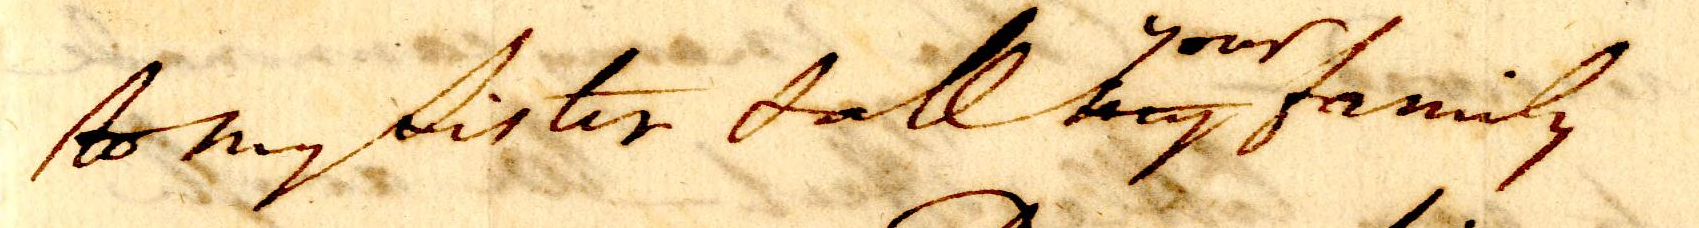to my Sister & all my family
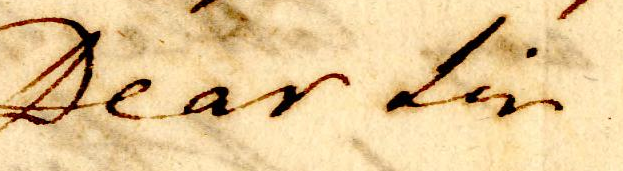Dear Sir
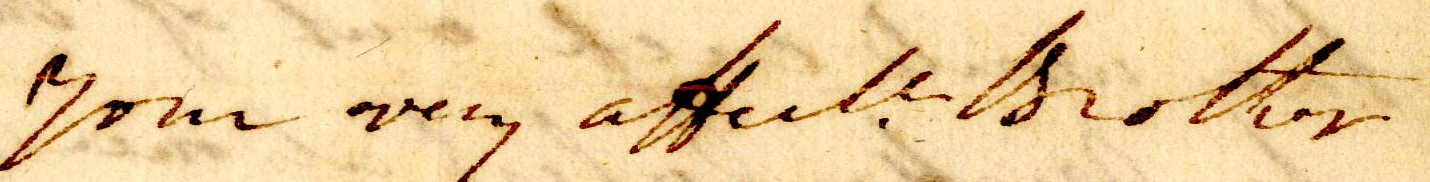Your very affect^e Brother
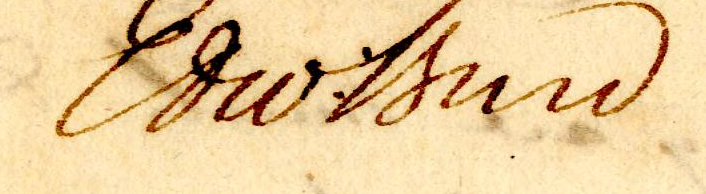Edw Burd
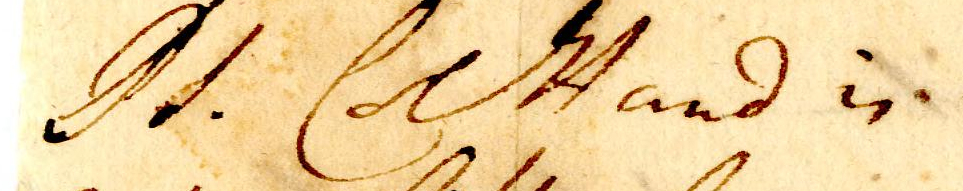PS. Col Hand is
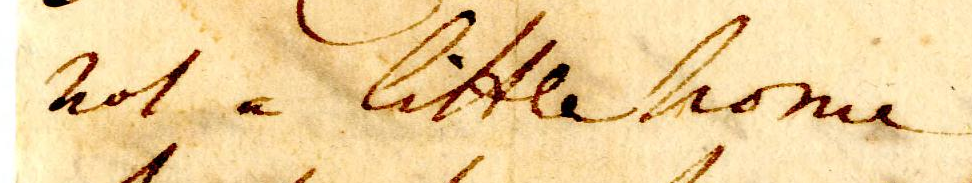not a little home
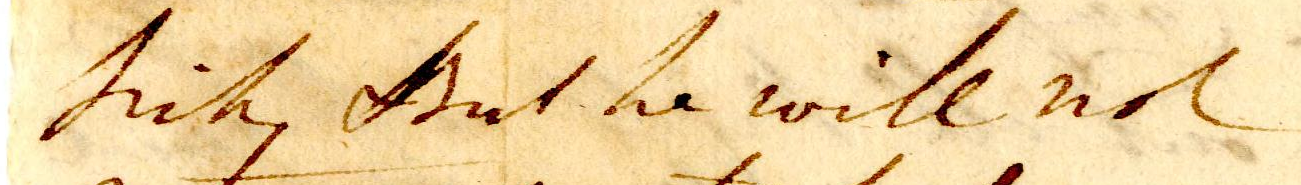Fish, but he will not
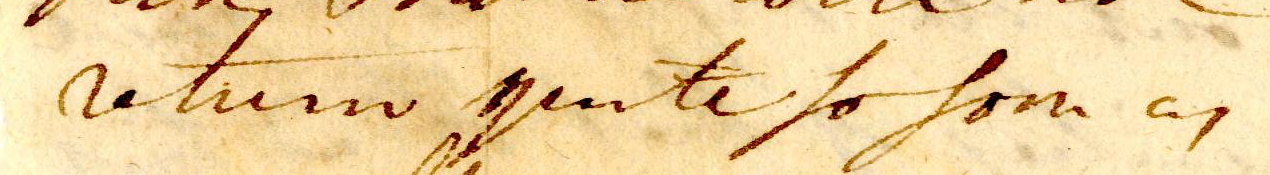return quote so soon as
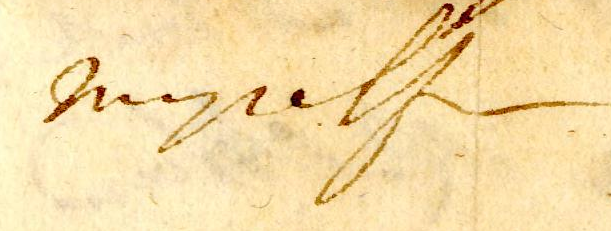myself
